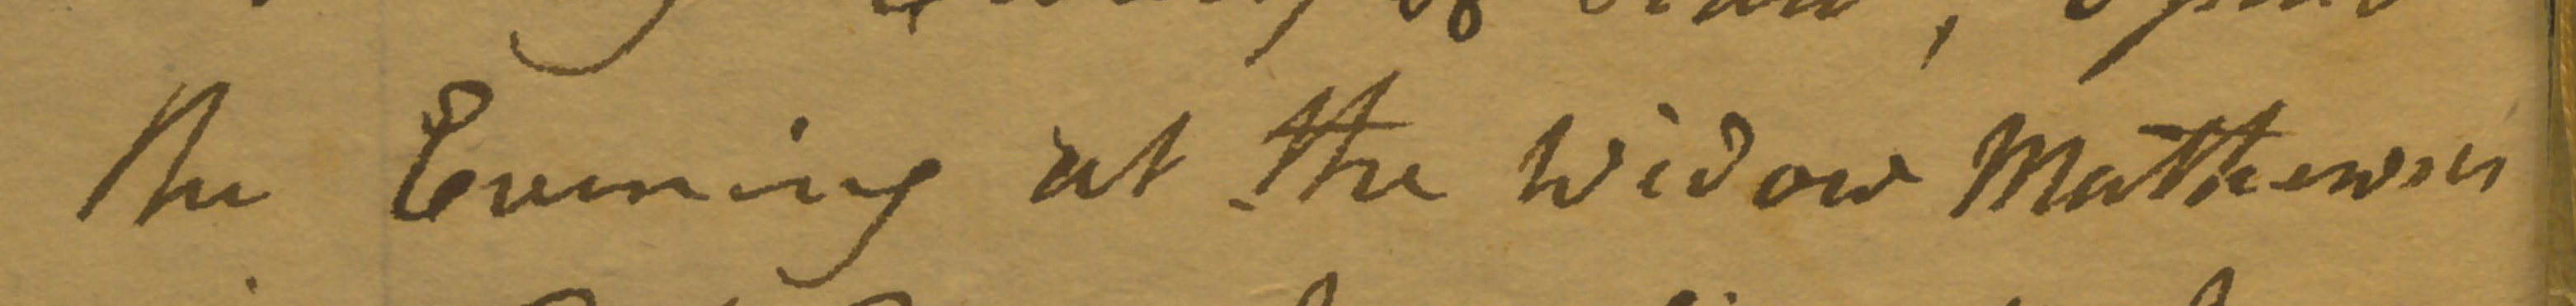the Evening at the Widow Mathewses
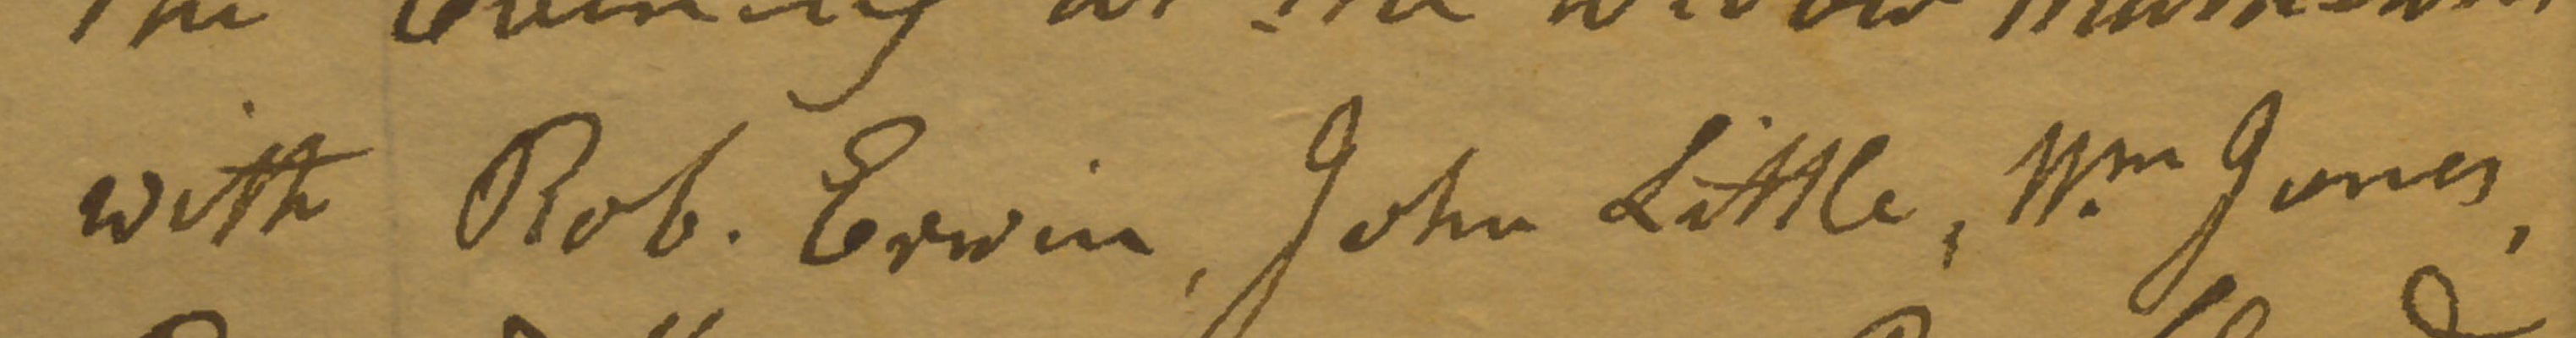with Rob. Erwin John Little, W^m. Jones
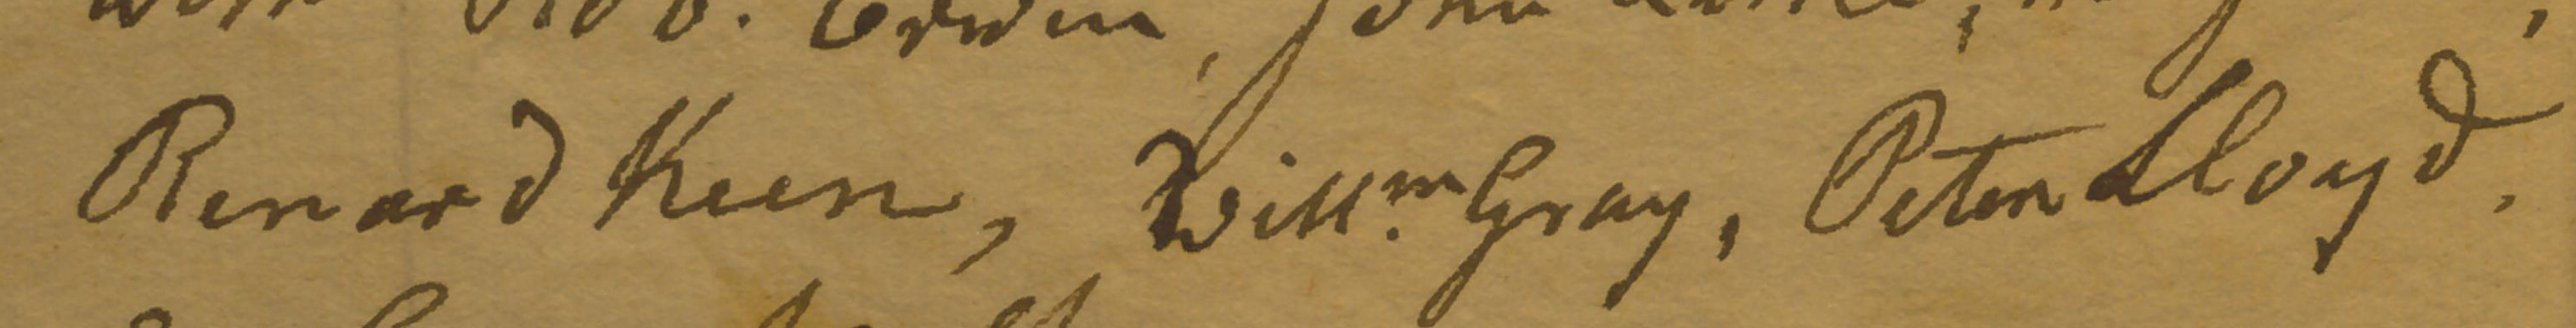Renard Kun, Will^m Gray, Peter Lloyd
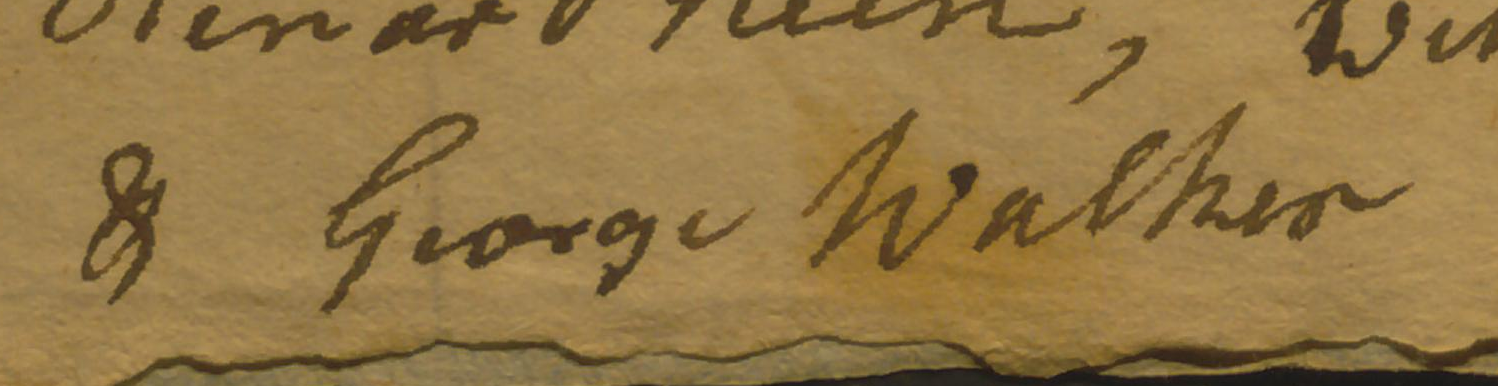& George Walker
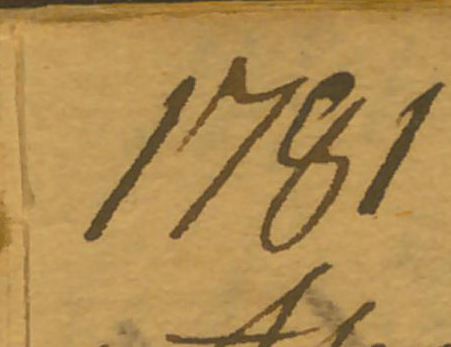1781
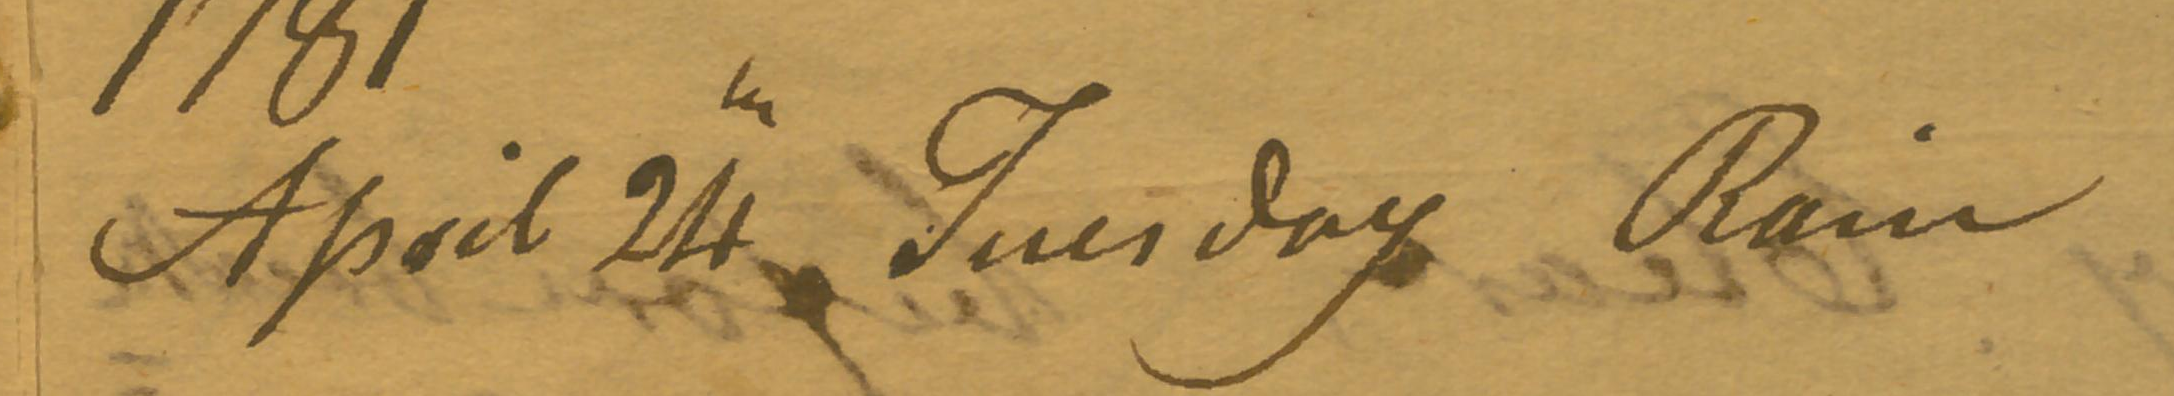April 24^th Tuesday Rain
